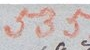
Florence
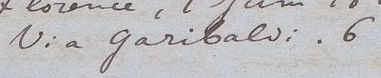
Via Garibaldi. 6
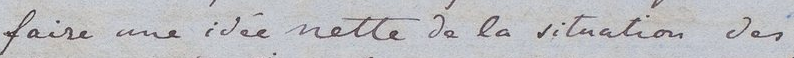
faire une idée nette de la situation des
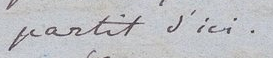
partit d'ici.
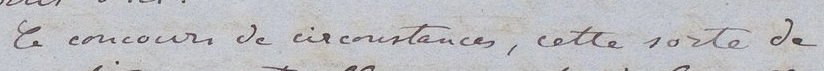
Ce concours de circonstances, cette sorte de
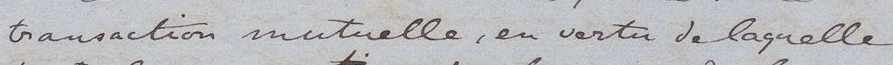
transaction mutuelle, en vertu de laquelle
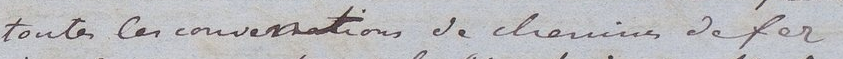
toutes les conventions de chemins de fer
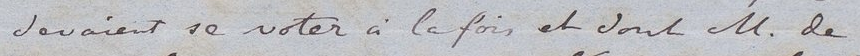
devaient se voter à la fois et dont M. de
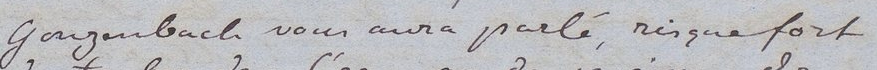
Gonzenbach vous aura parlé, risque fort
